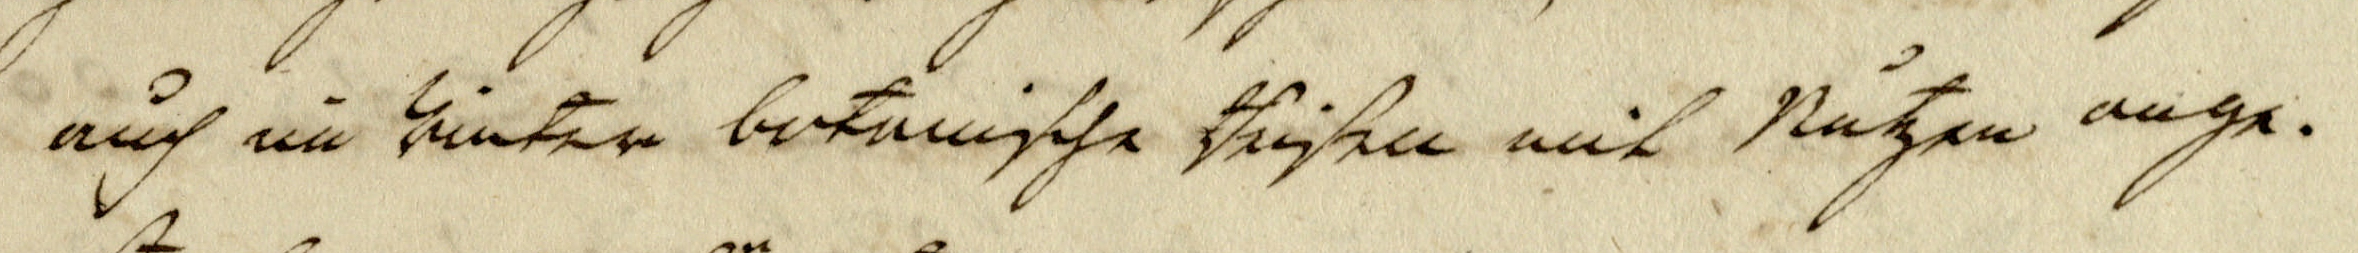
auch im Winter botanische Reisen mit Nutzen ange¬
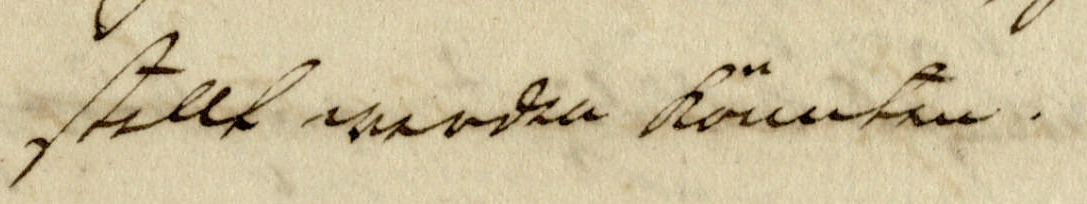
stellt werden könnten.
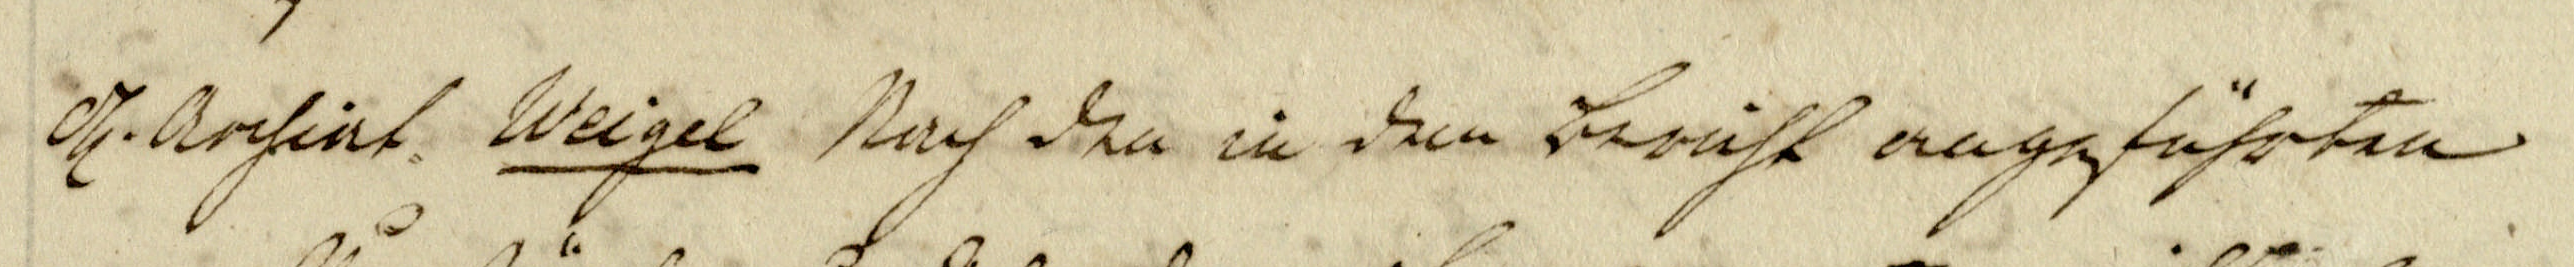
dh. Archiat. Weigel. Nach den in dem Bericht angeführten
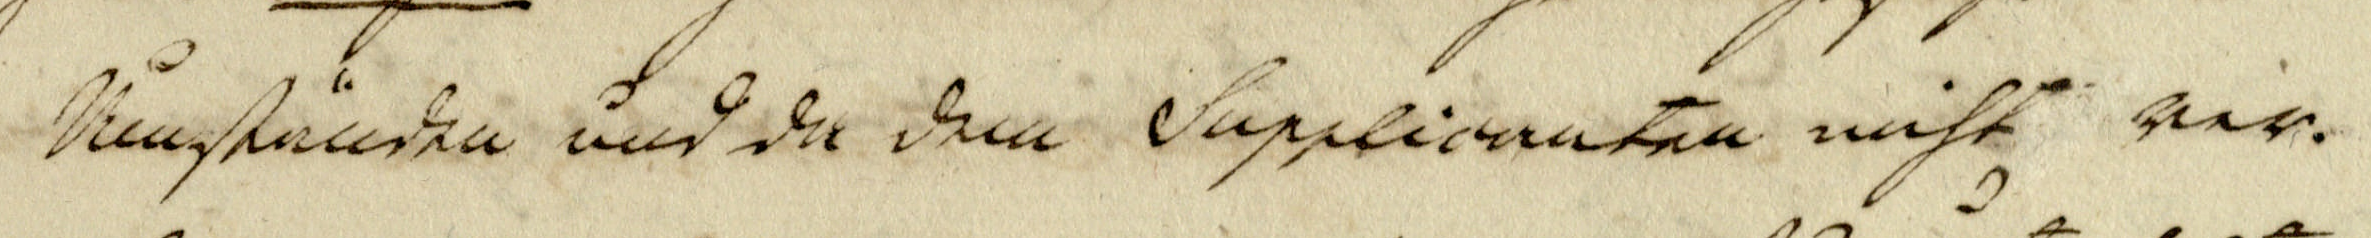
Umständen und da dem Supplicanten nicht ver¬
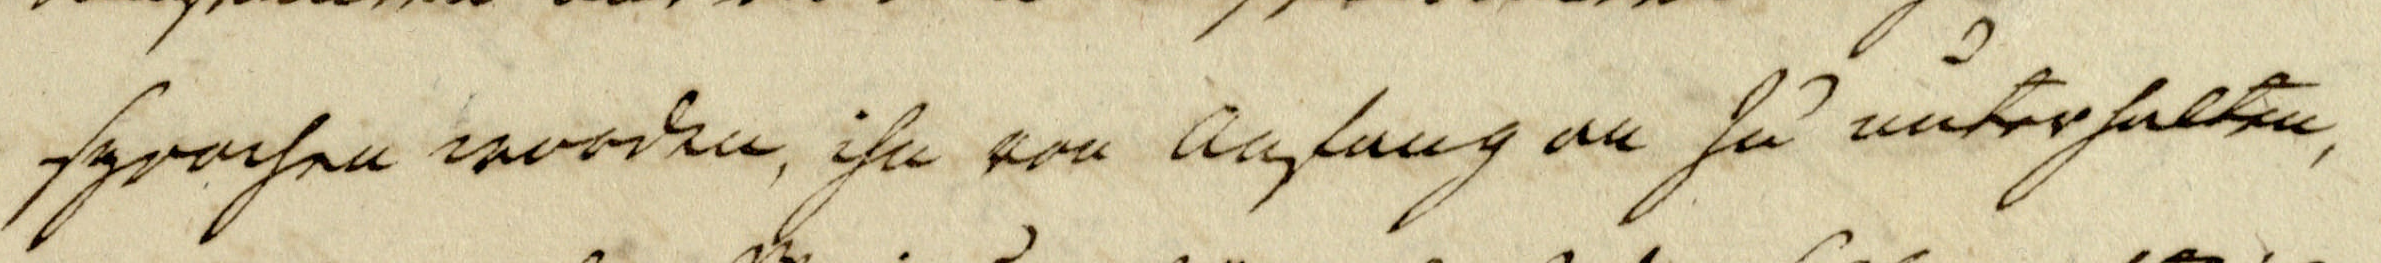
sprochen worden, ihn von Anfang an zu unterhalten,
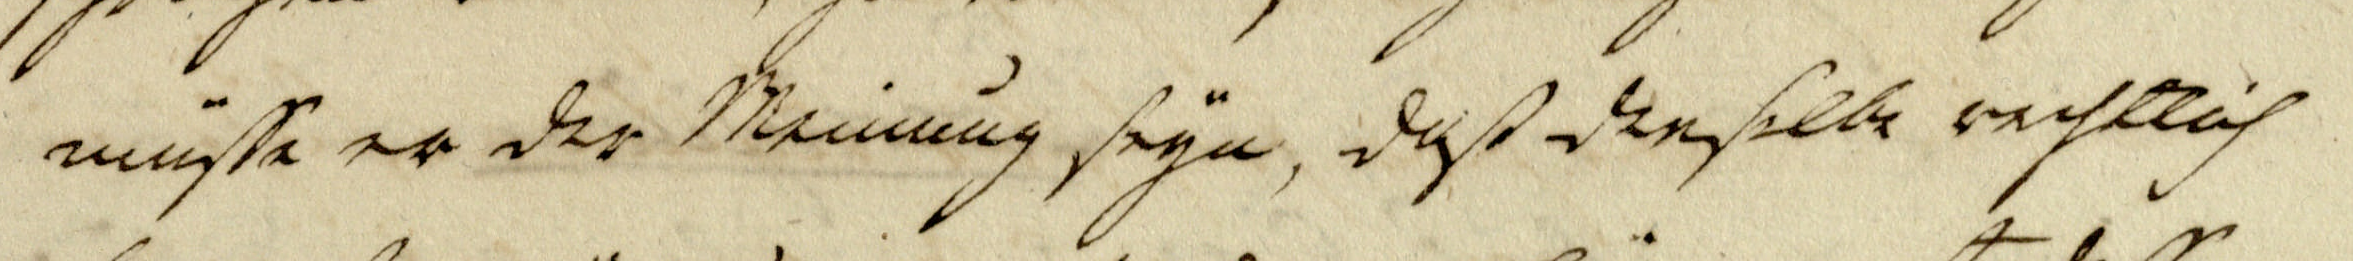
müsse er der Meinung seÿn, daß dieselbe rechtlich
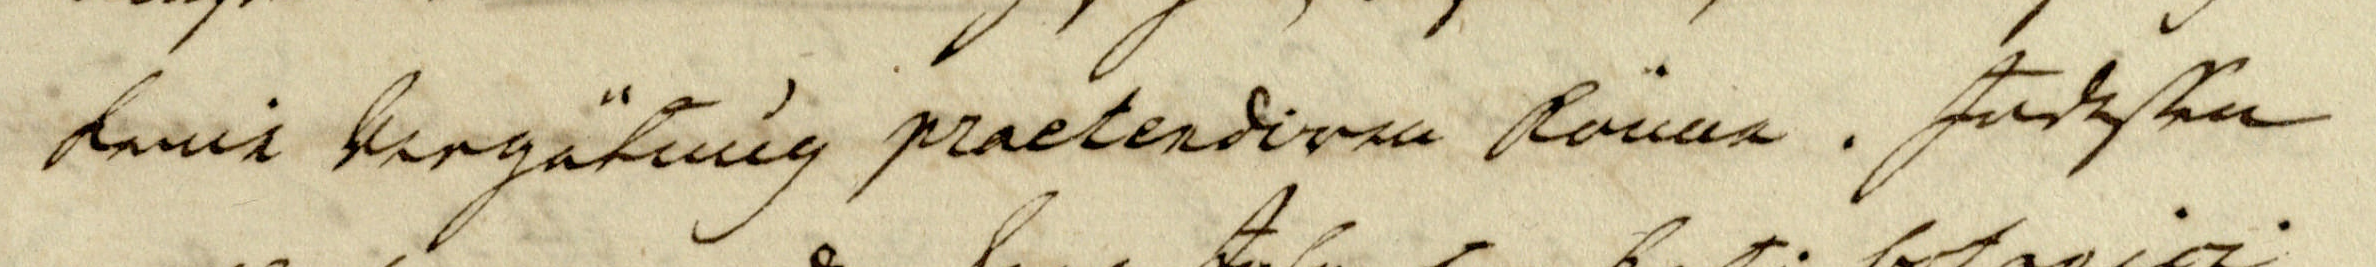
keine Vergütung praetendiren könne. Indessen
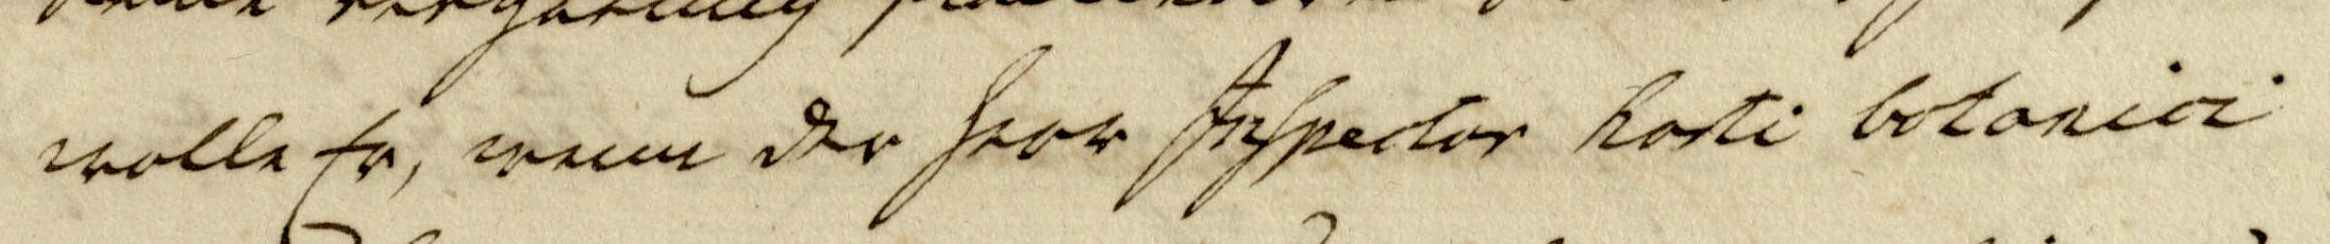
wolle Er, wenn der Herr Inspector horti botanici
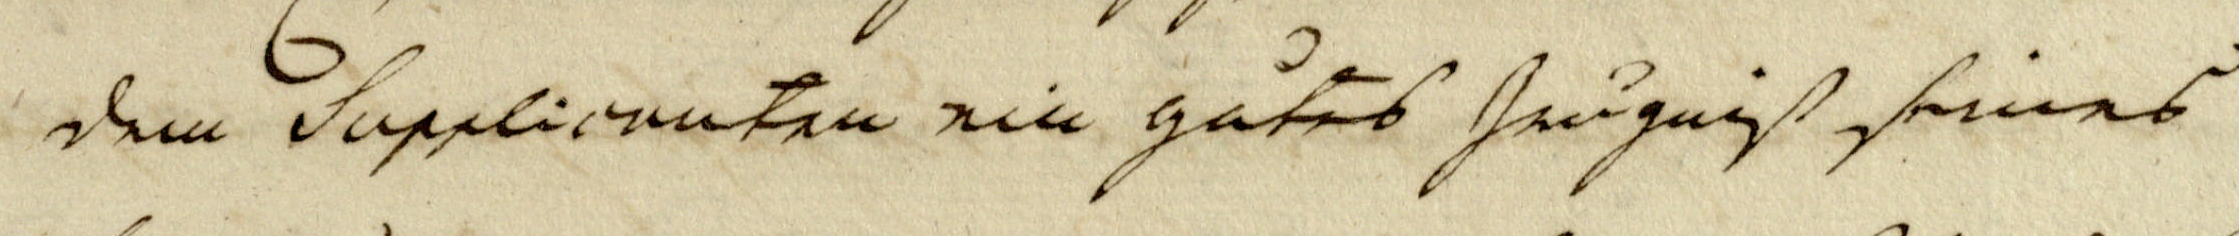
dem Supplicanten ein gutes Zeugniß seines
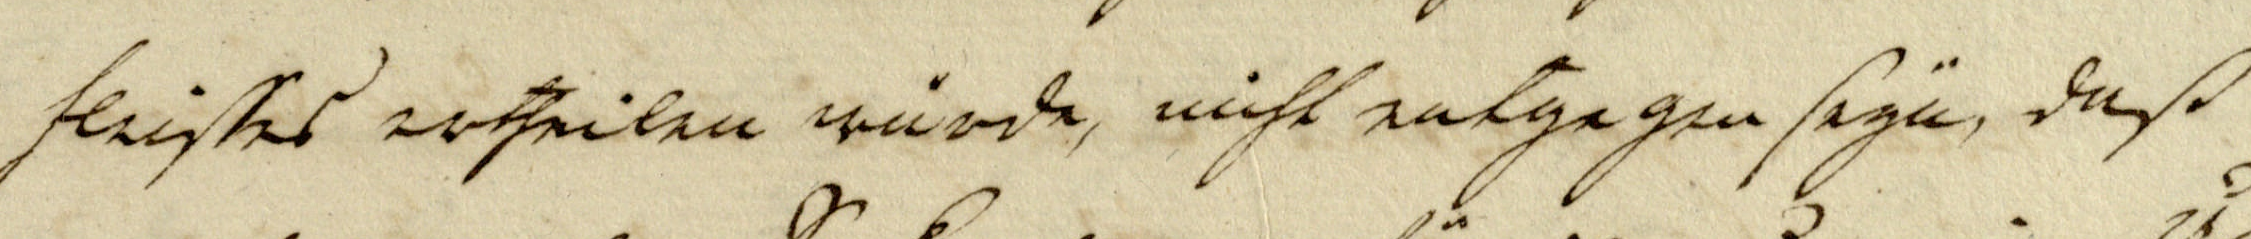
Fleisses ertheilen würde, nicht entgegen seÿn, daß
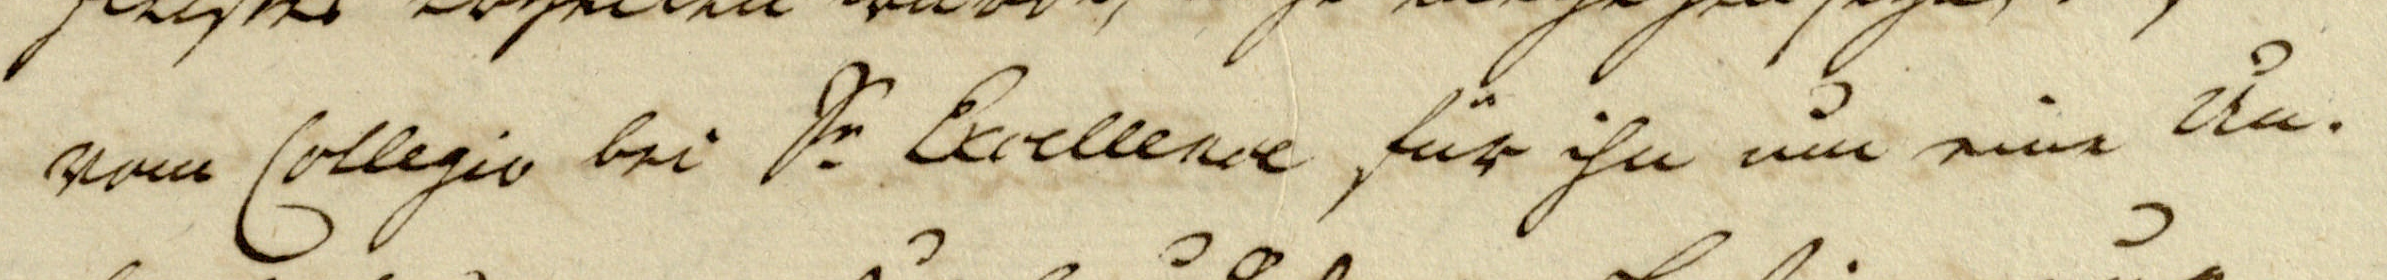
vom Collegio bei Sr Excellence für ihn um eine Un¬
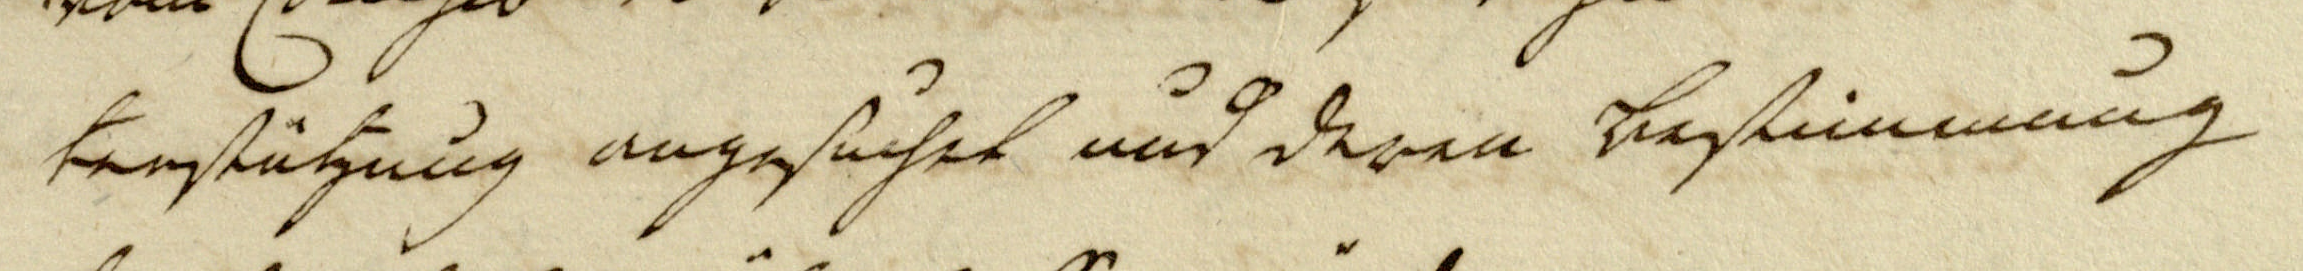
terstützung angesuchet und deren Bestimmung
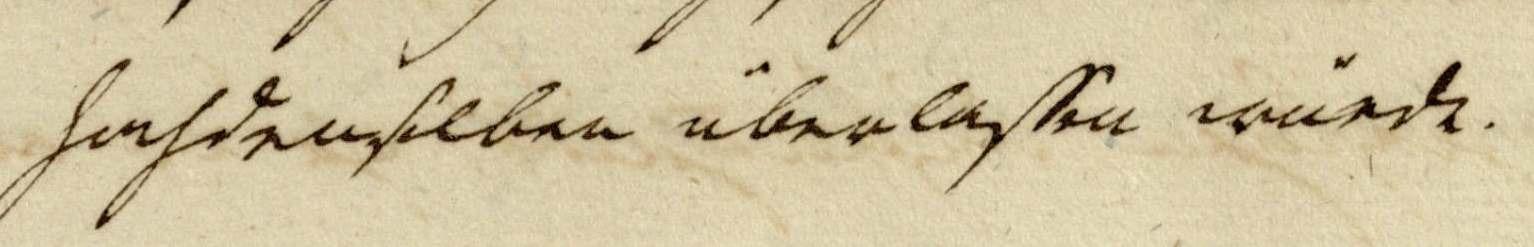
Hochdemselben überlassen würde.
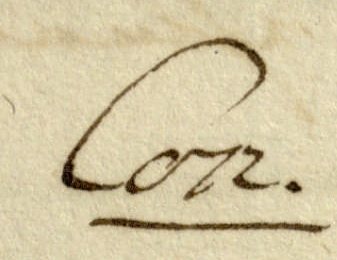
Con¬
